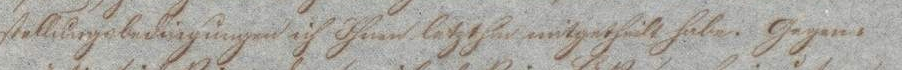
stellungsbedingungen ich Ihnen letzthin mitgetheilt habe. Gegen-
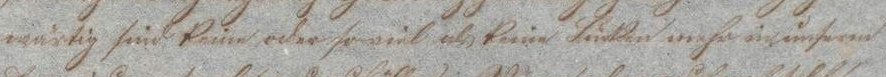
wärtig sind keine oder so viel als keine Lücken mehr in unserm
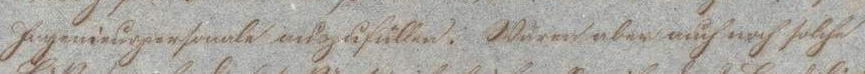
Ingenieurpersonale auszufüllen. Wären aber auch noch solche
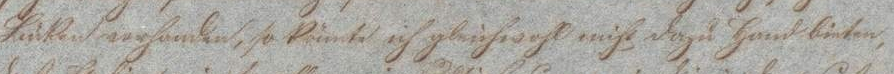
Lücken vorhanden, so könnte ich gleichwohl nicht dazu Hand bieten,
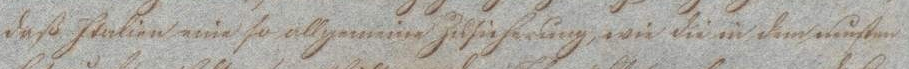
daß Italien eine soallgemeine Zusicherung, wie die in dem neusten
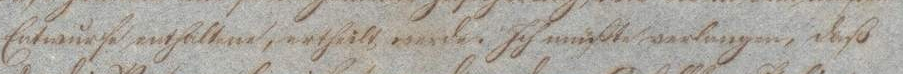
Entwurfe enthaltene, ertheilt werde. Ich müßte verlangen, daß
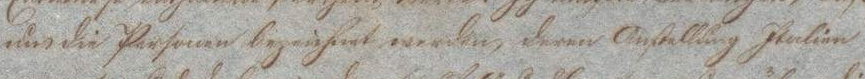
uns die Personen bezeichnet werden, deren Anstellung Italien
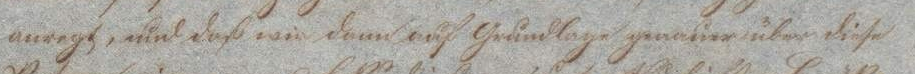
anregt, und daß wir dann auf Grundlage genauer über diese
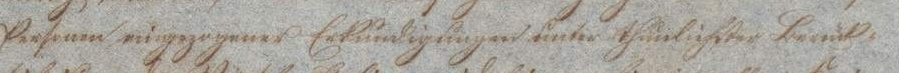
Personen eingezogener Erkundigungen unter thunlichster Berück-
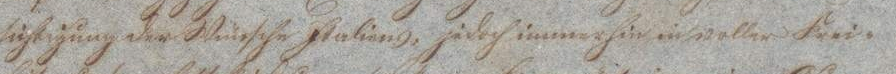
sichtigung der Wünsche Italiens, jedoch immerhin in voller Frei-
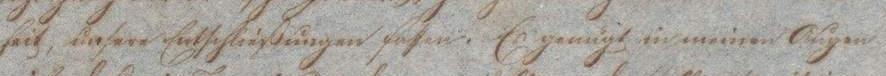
heit, unsere Entschliessungen fassen. Es genügt in meinen Augen
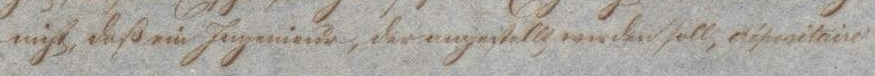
nicht, daß ein Ingenieur, der angestellt werden soll, dépositaire
